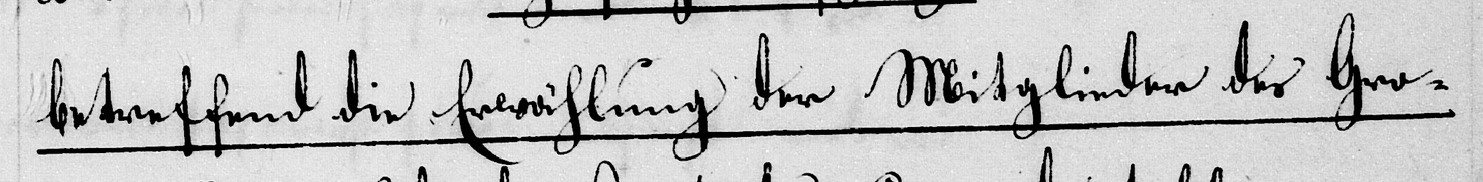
betreffend die Erwählung der Mitglieder des Gro¬
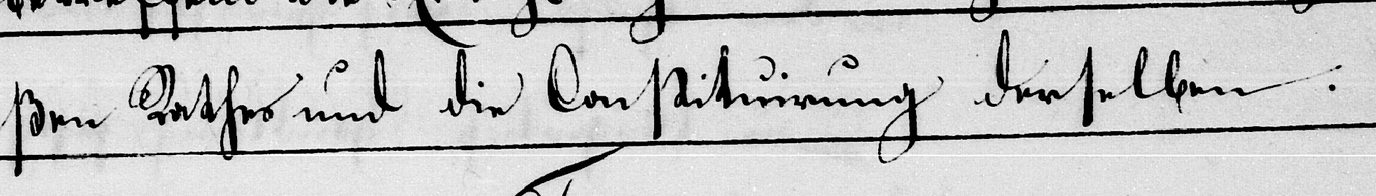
ßen Rathes und die Constituirung derselben.
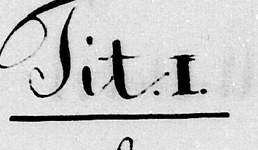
Tit. I
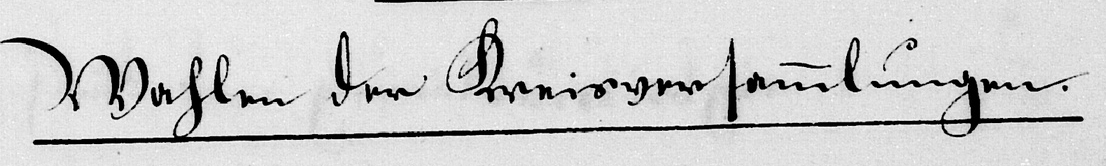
Wahlen der Kreisversammlungen.
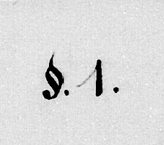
§.1.
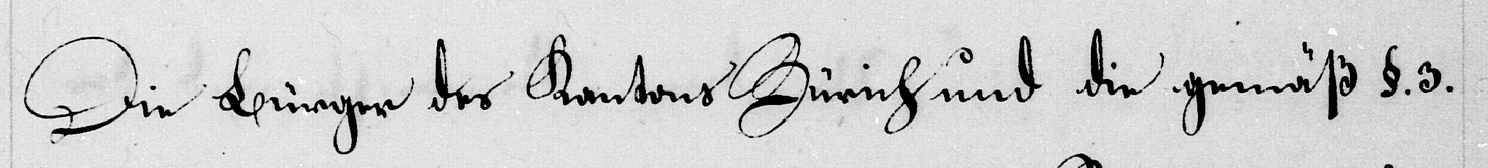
Die Bürger des Kantons Zürich und die gemäß §.3.
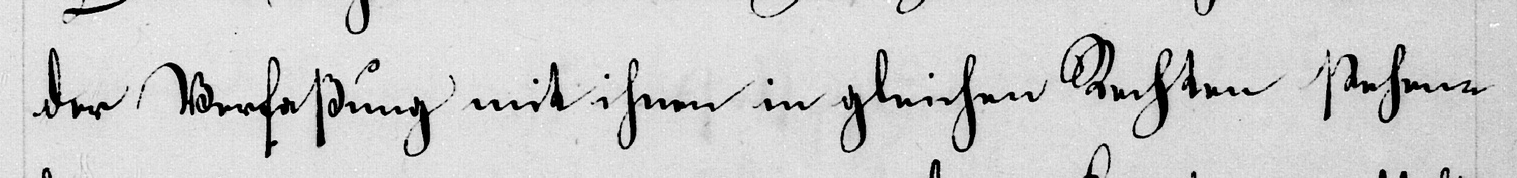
der Verfaßung mit ihnen in gleichen Rechten stehen¬
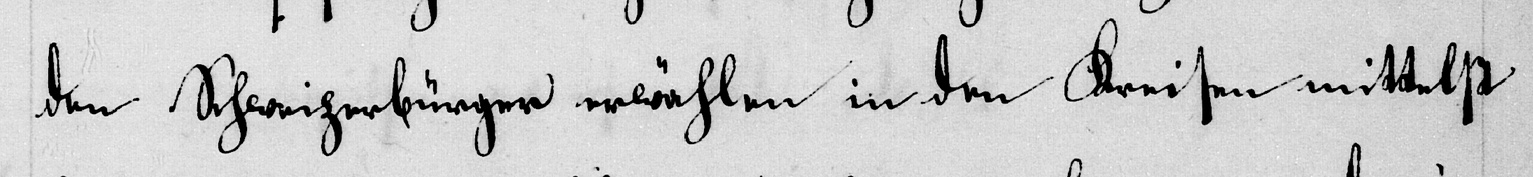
den Schweizerbürger erwählen in den Kreisen mittelst
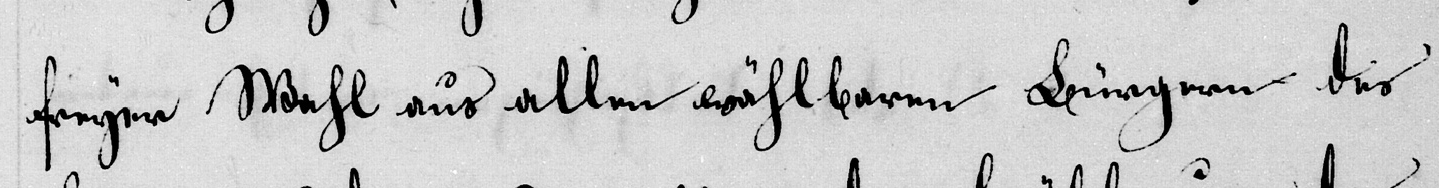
freyer Wahl aus allen wählbaren Bürgern des
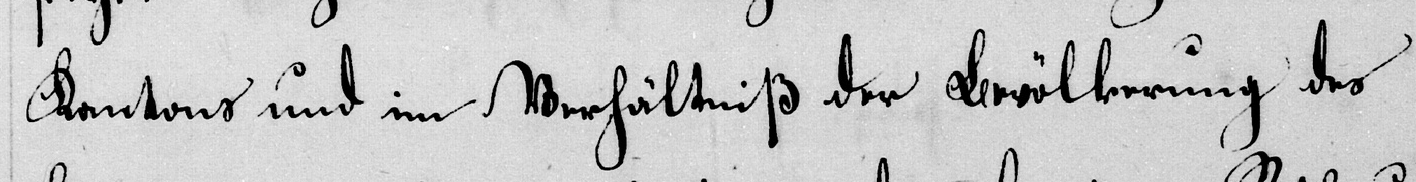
Kantons und im Verhältniß der Bevölkerung des
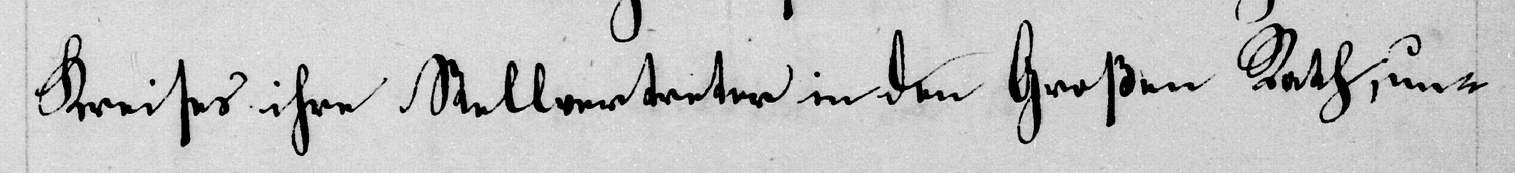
Kreises ihre Stellvertreter in den Großen Rath, un-
